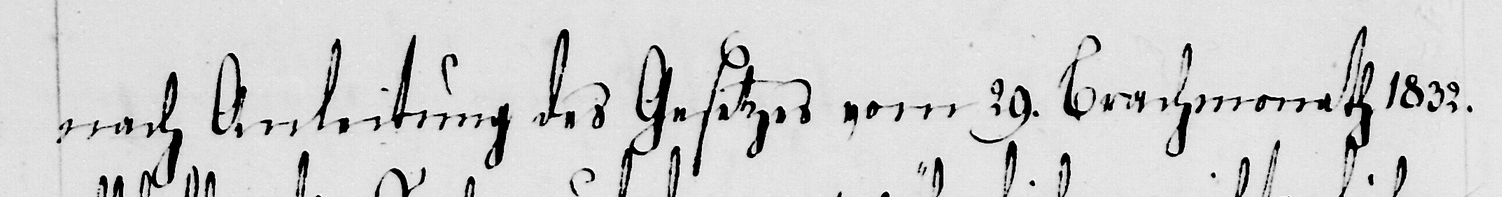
nach Anleitung des Gesetzes vom 29. Brachmonath 1832.
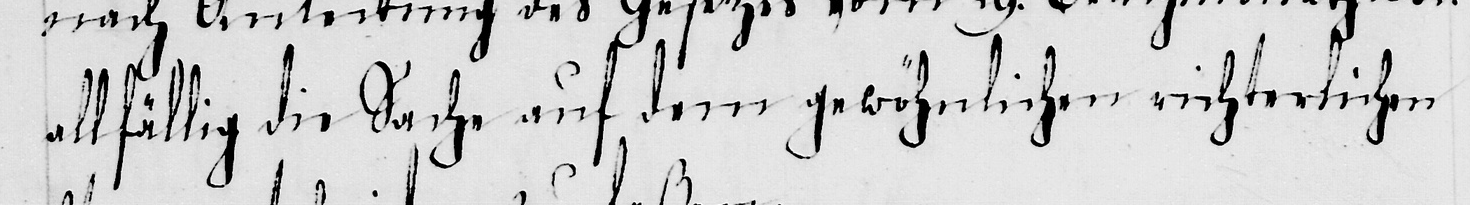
allfällig die Sache auf dem gewöhnlichen richterlichen
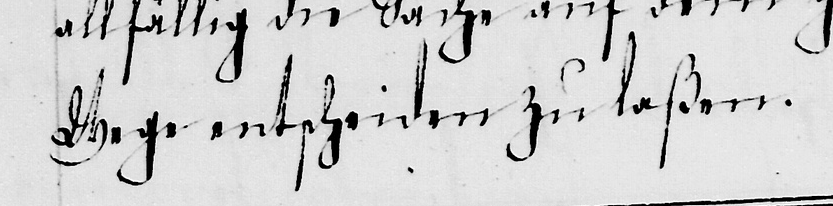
Wege entscheiden zu laßen.
